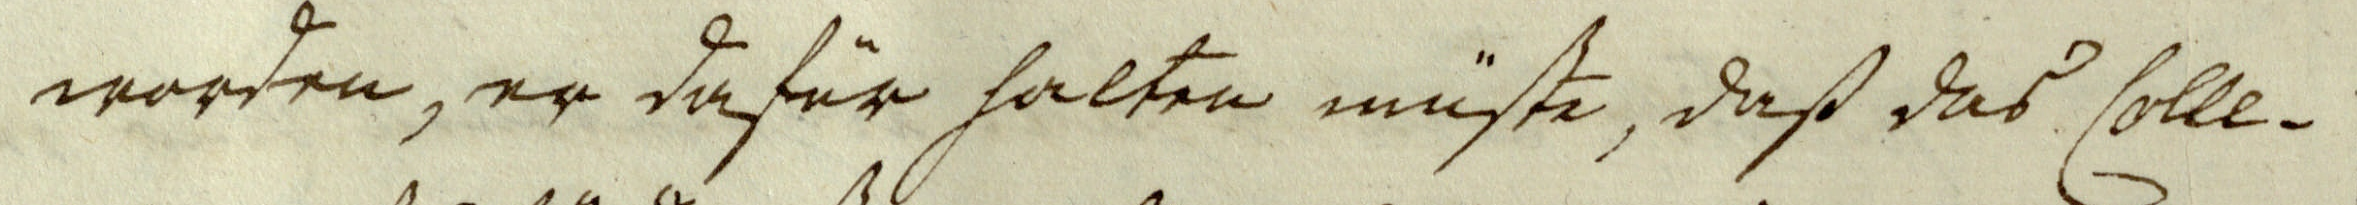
worden, er dafür halten müsste, daß das Colle¬
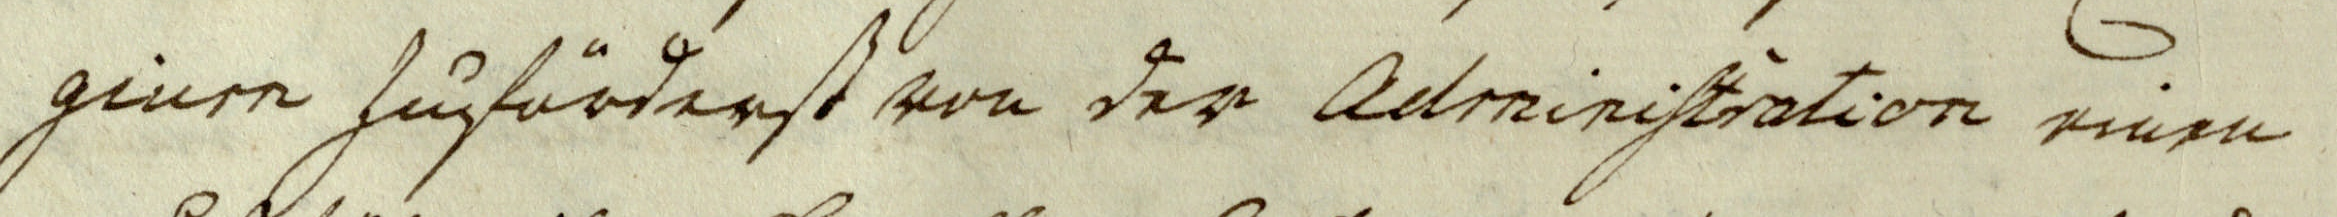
gium zuförderst von der Administration einen
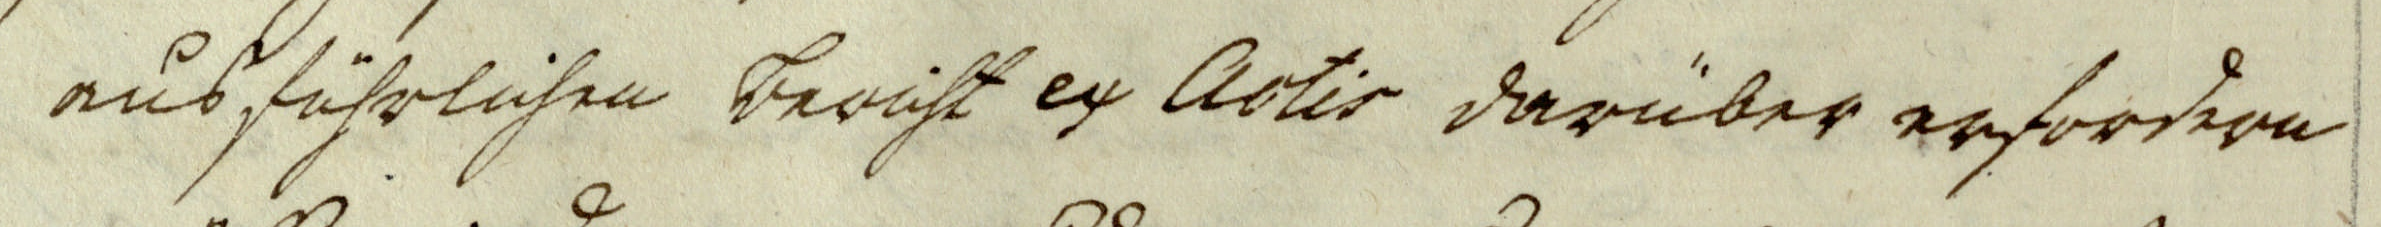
ausführlichen Bericht ex Actis darüber erfordern
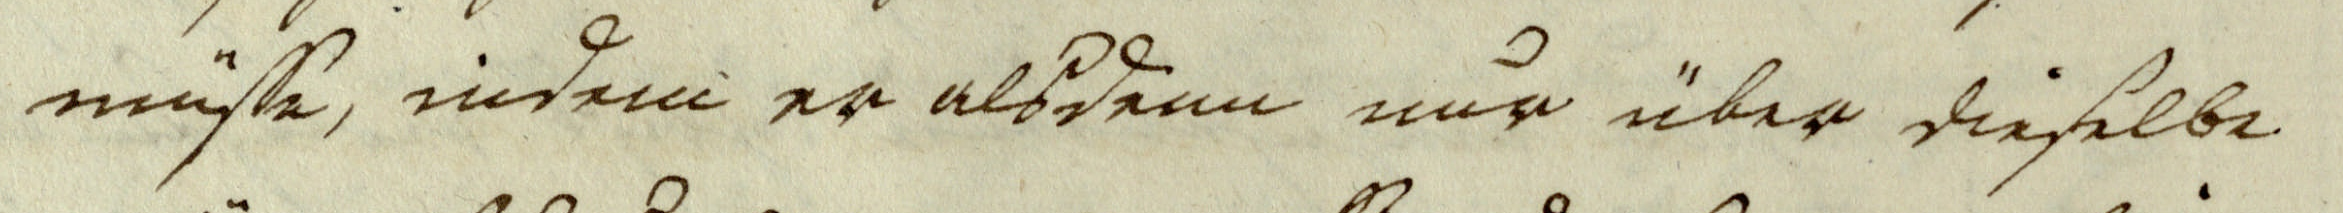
müsse, indem er alsdann nur über dieselbe
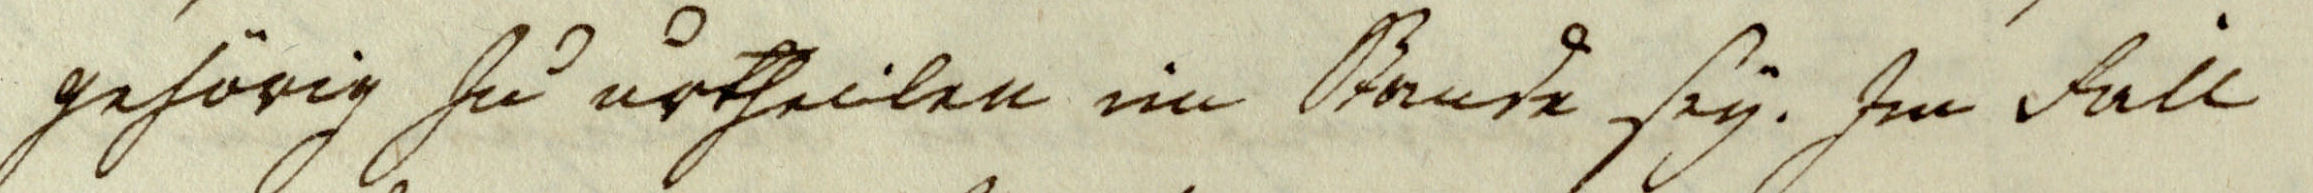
gehörig zu urtheilen im Stande seÿ. Im Fall
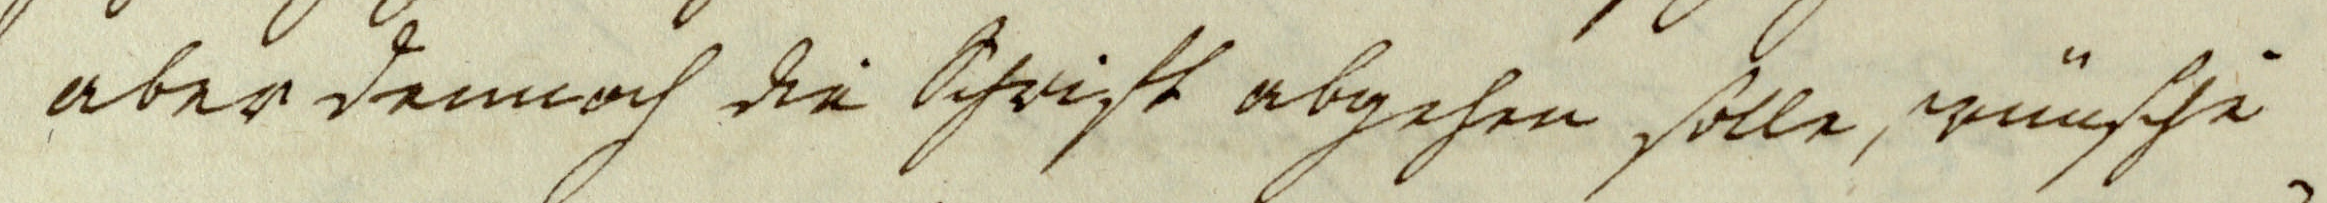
aber dennoch die Schrift abgehen solle, wünscht
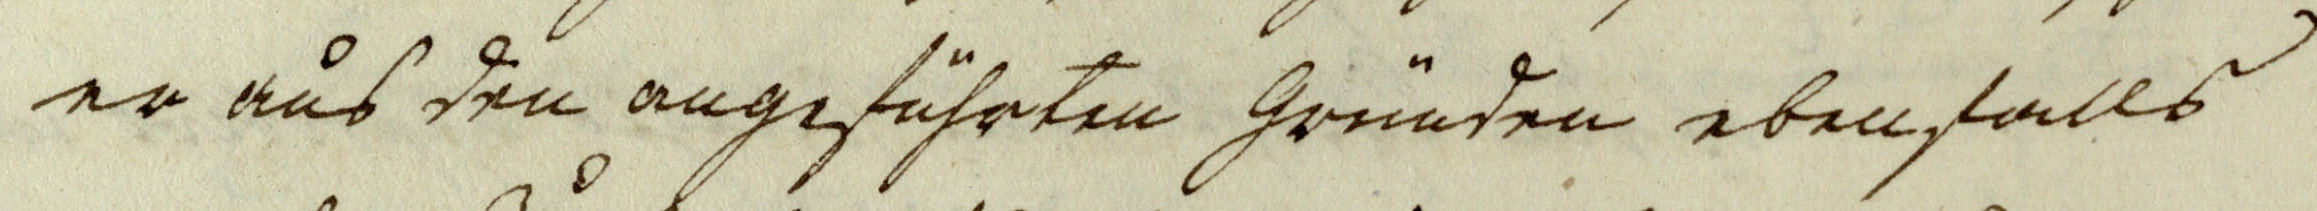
er aus den angeführten Gründen ebenfalls
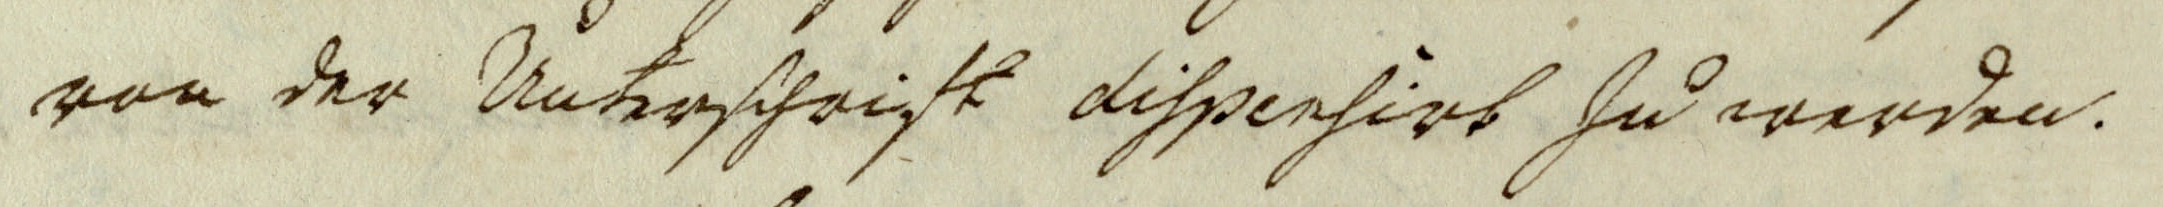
von der Unterschrift dispensirt zu werden.
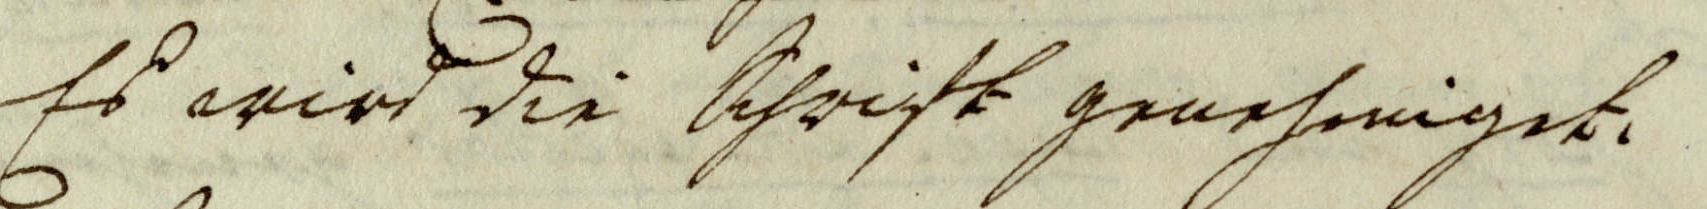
Es wird die Schrift genehmigt.
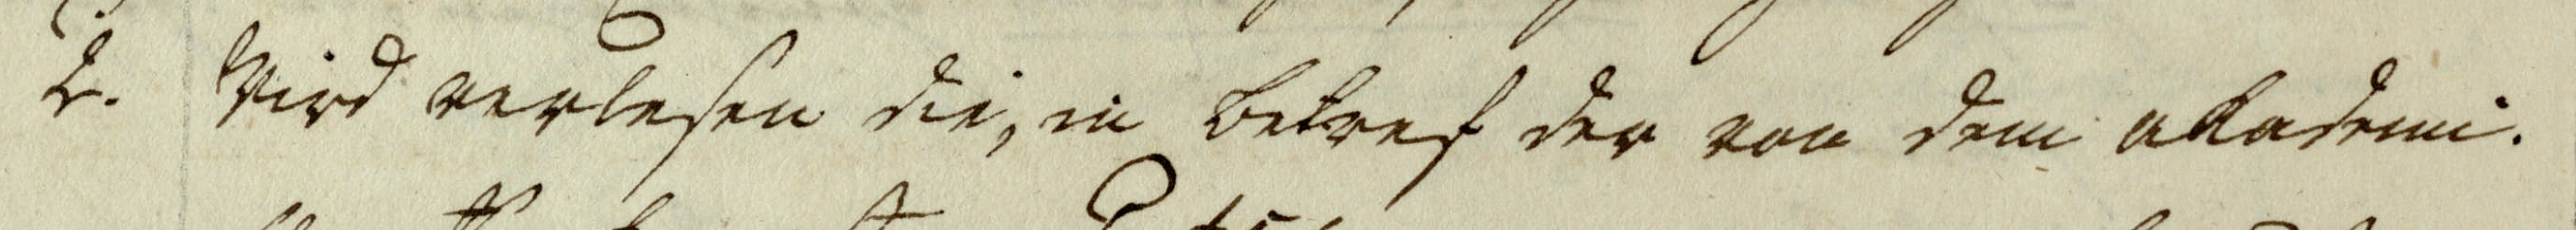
2. Wird verlesen die, in Betref der von dem akademi¬
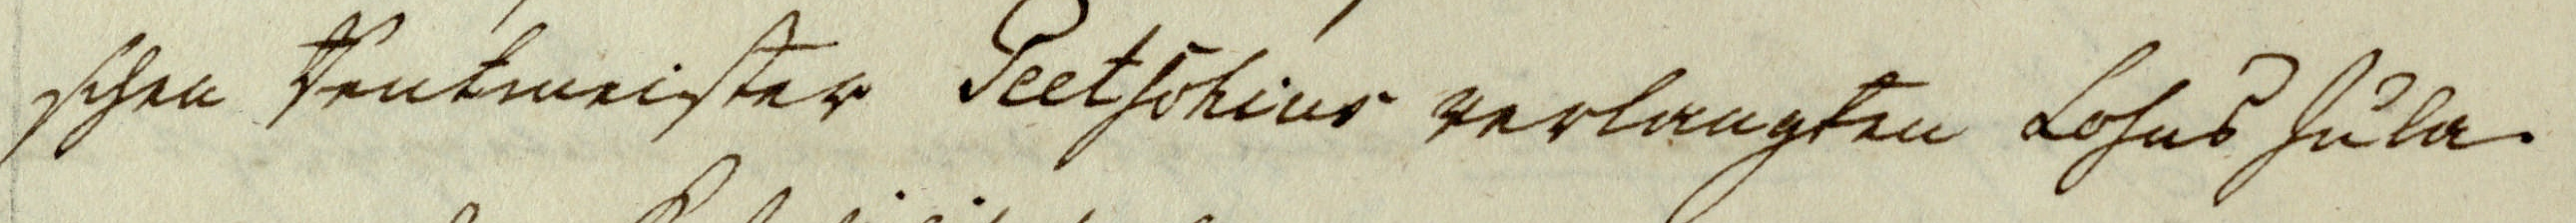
schen Rentmeister Peetsohius verlangten Lohns Zula¬
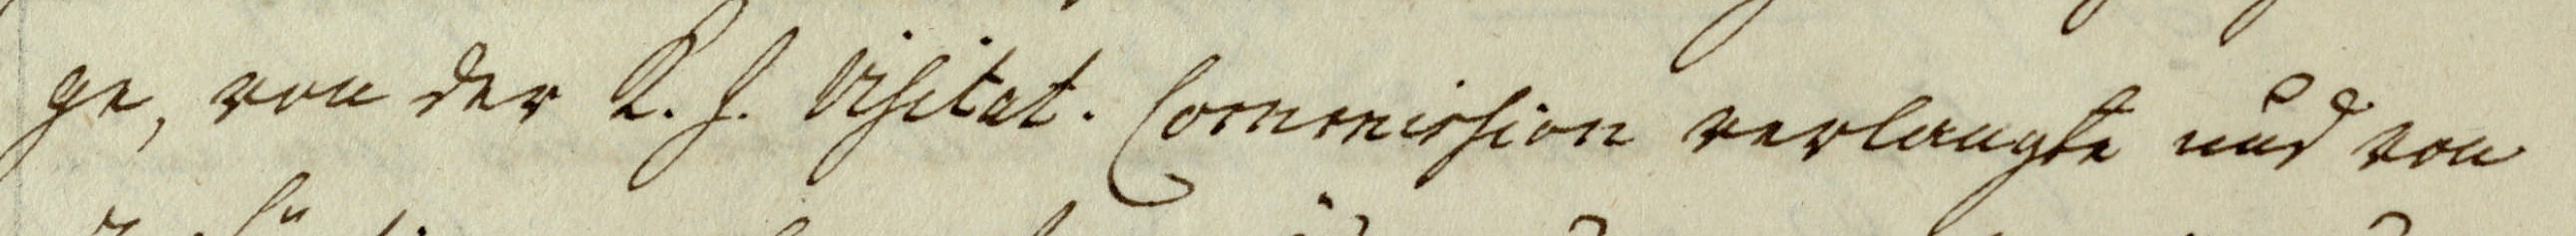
ge, von der K. H. Visitat. Commission verlangte und von
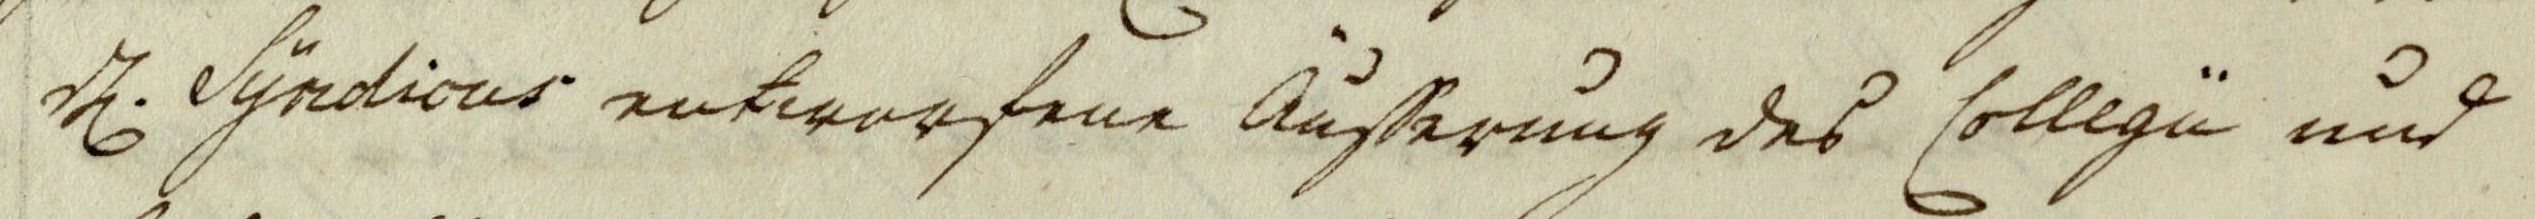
dh. Sÿndicus entworfene Äusserung des Collegii und
